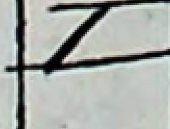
I
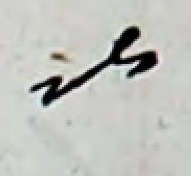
do
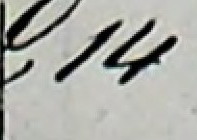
0,14
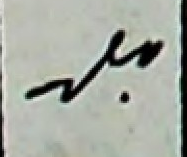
do
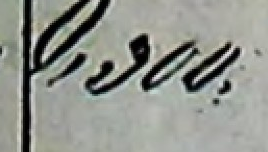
0,300
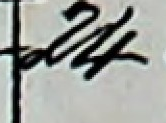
24
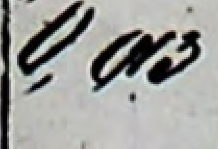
0,013
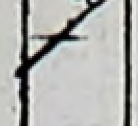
7
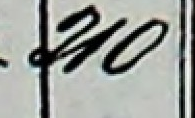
210
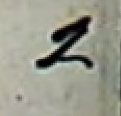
2
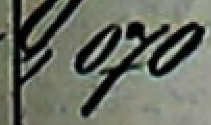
0,070
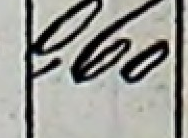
0,60
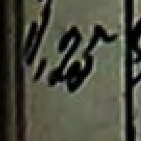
3,25
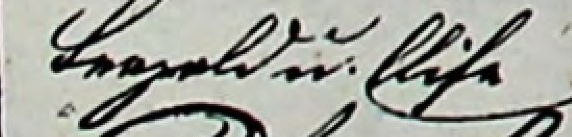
Leopold u. Elise
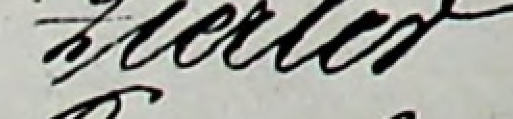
Zierler
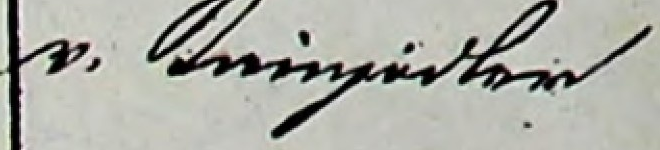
v. Kainjedler
